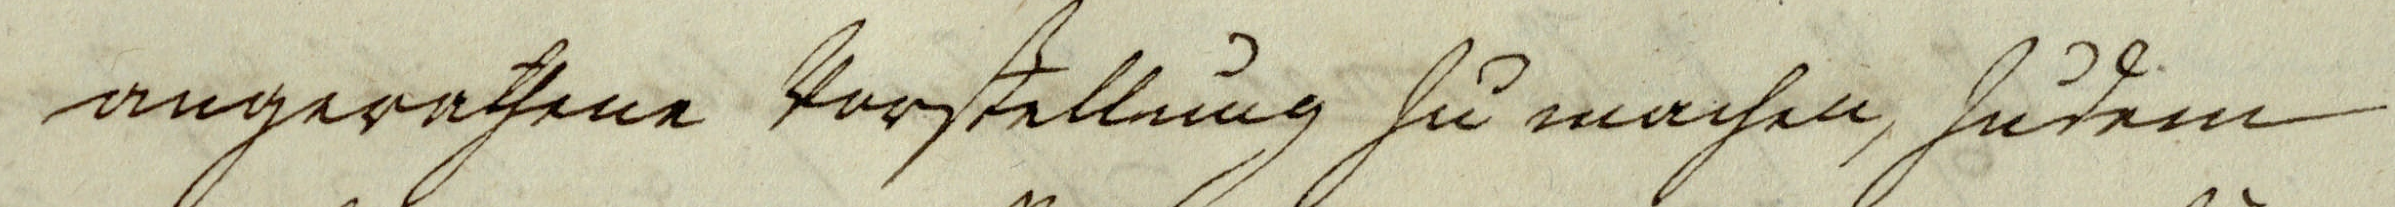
angerathene Vorstellung zu machen, zudem
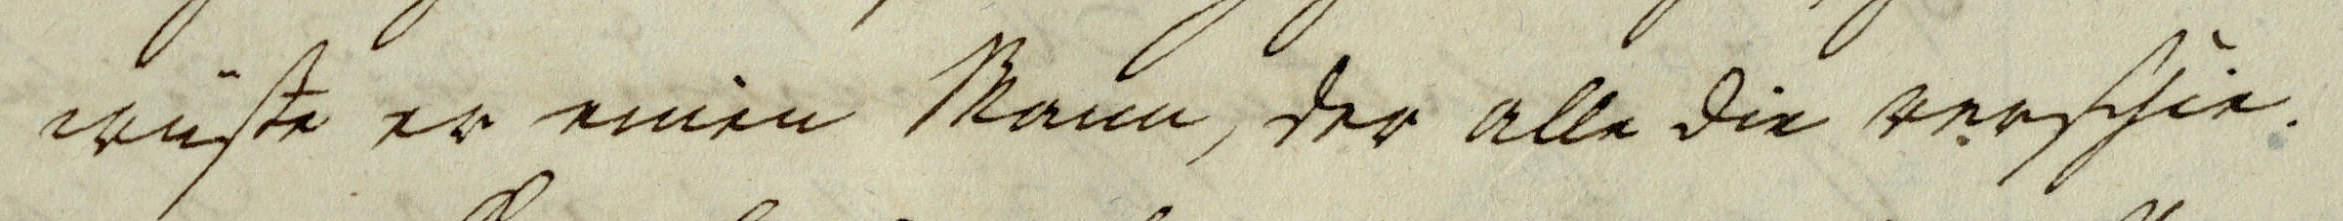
wüßte er einen Mann, der alle die verschie¬
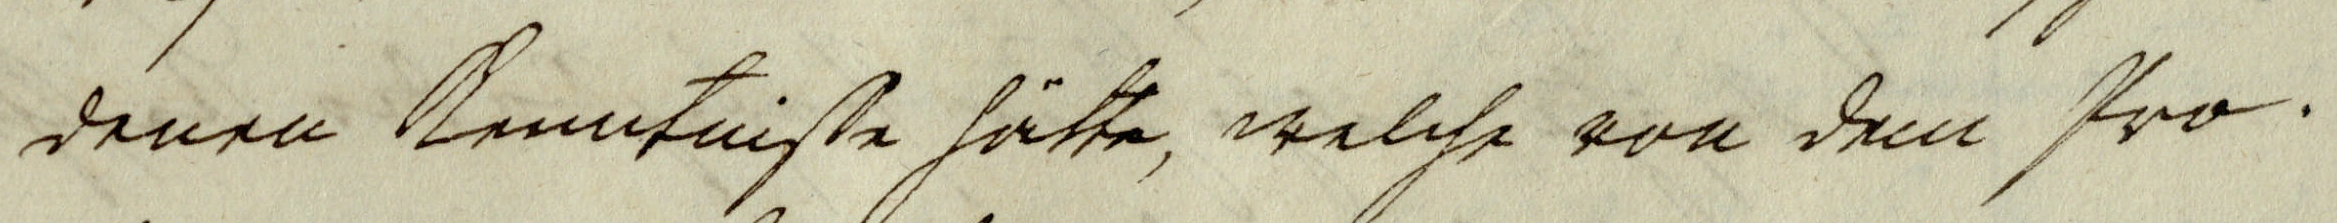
denen Kenntnisse hätte, welche von dem Pro¬
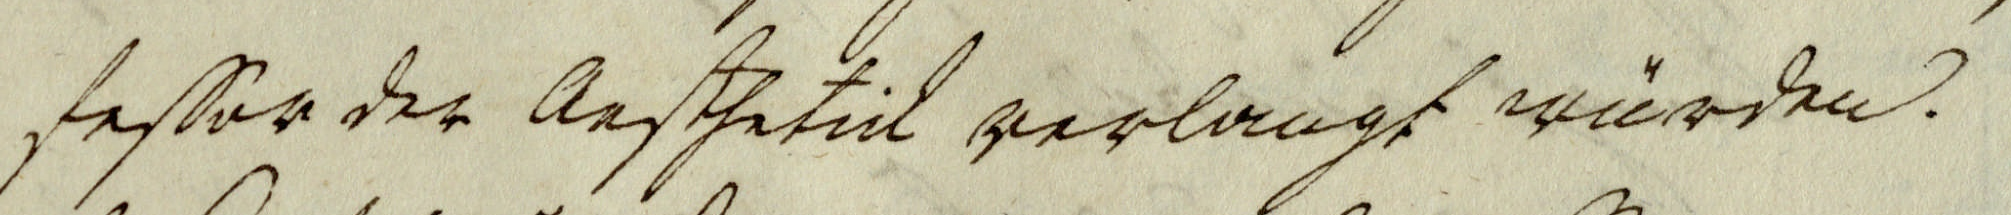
fessor der Aesthetick verlangt würden.
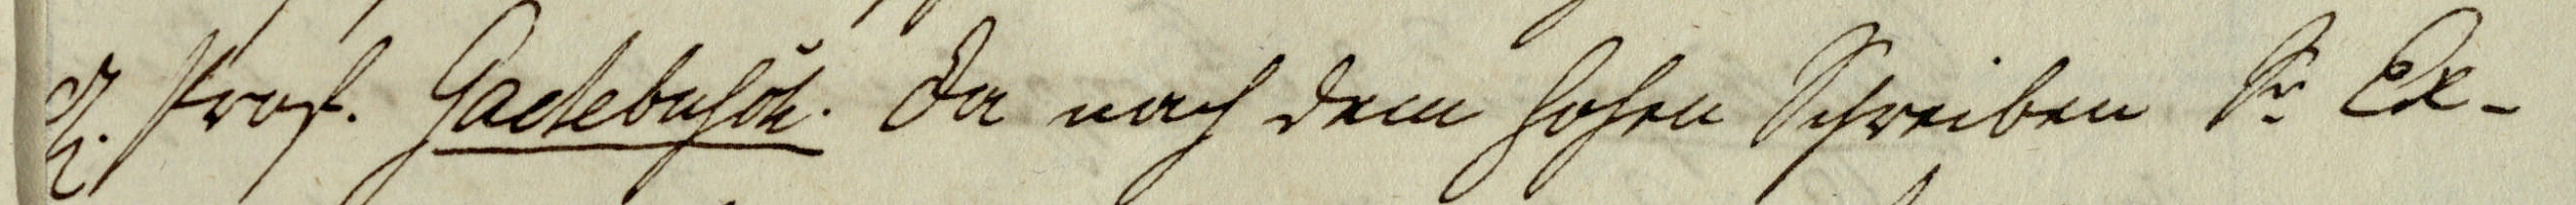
dh. Prof. Gadebusch. Da nach dem hohen Schreiben Sr. Ex¬
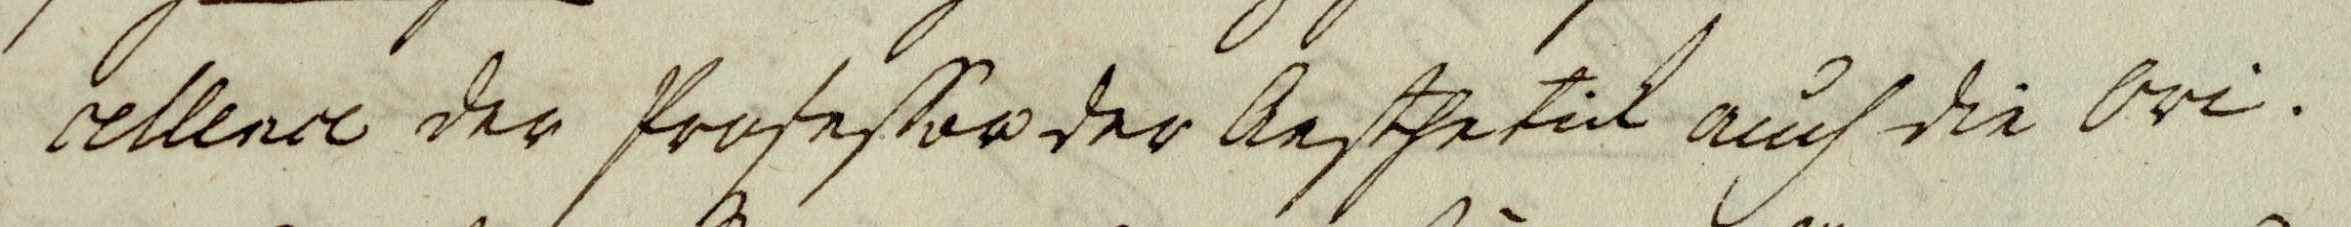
cellence der Professor der Aesthetick auch die Ori¬
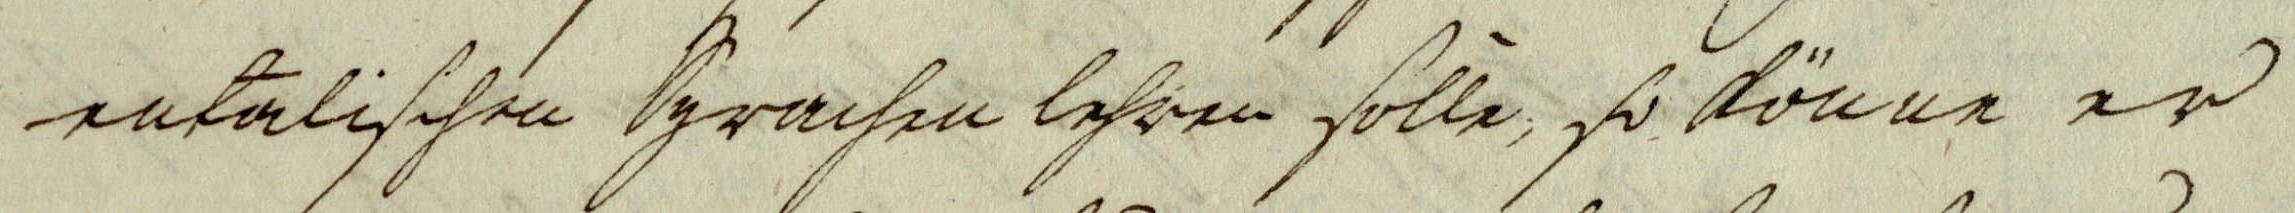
entalischen Sprachen lehren solle, so könne er
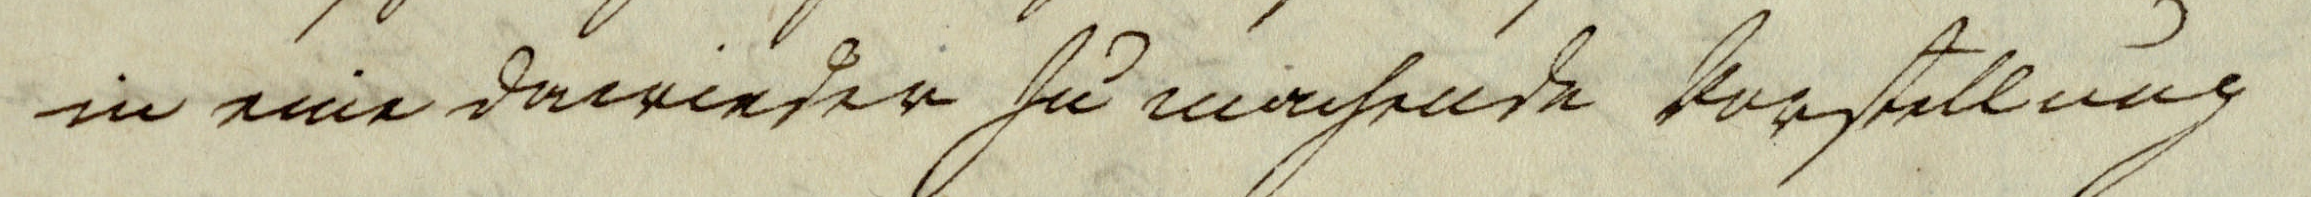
in eine dawieder zu machende Vorstellung
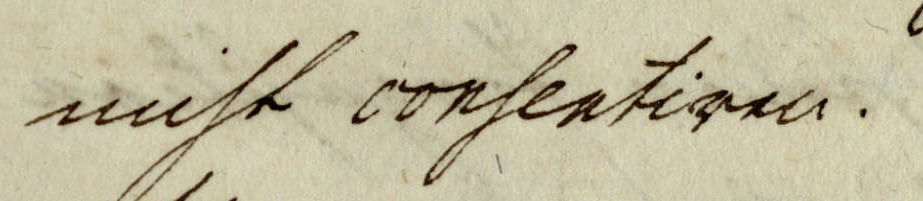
nicht consentiren.
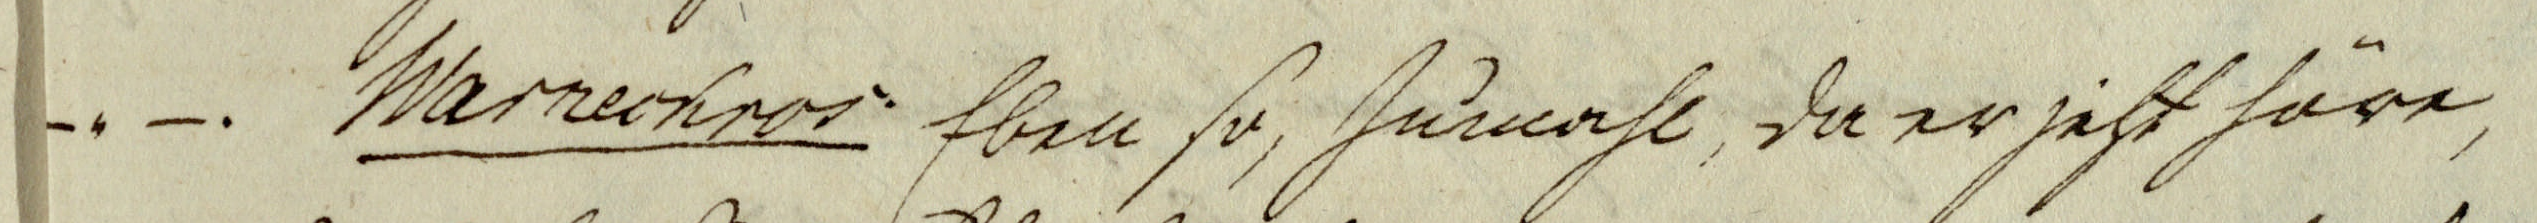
— " — . Warneckros. Eben so, zumahl da er jetzt höre,
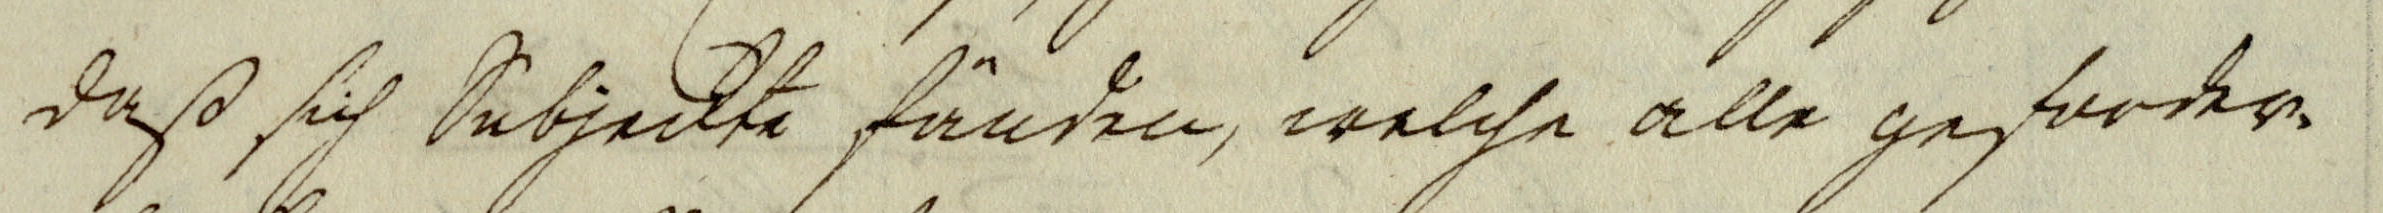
daß sich Subjeckte fänden, welche alle geforder¬
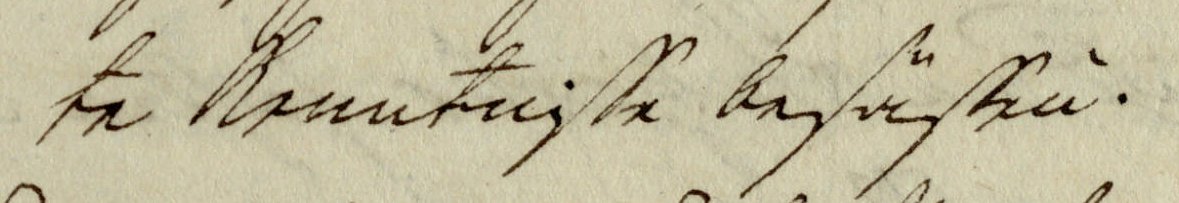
te Kenntnisse besässen.
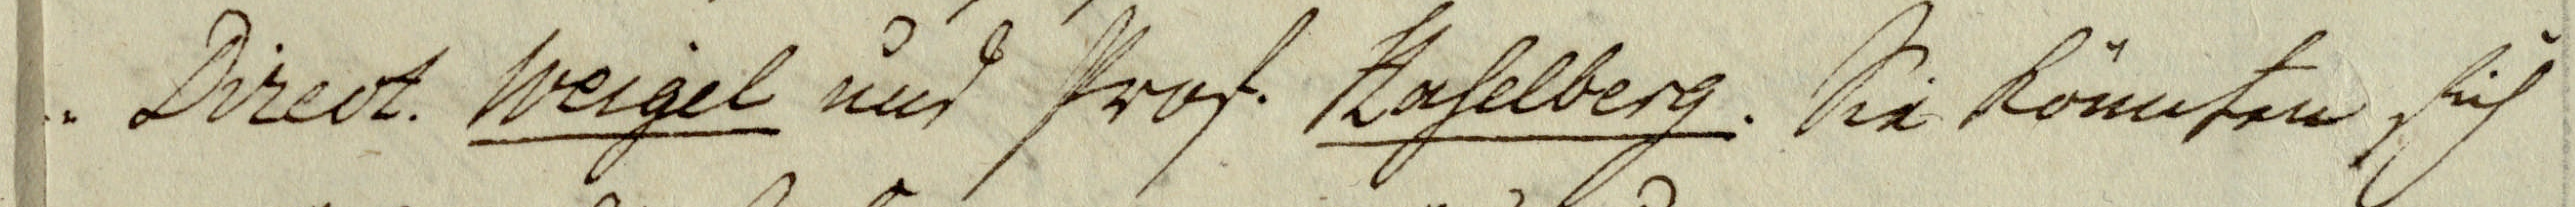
— . Direct. Weigel und Prof. Haselberg. Sie könnten sich
